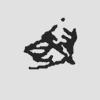夏
